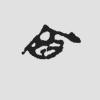亯
